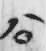公
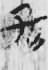孫
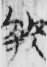○（狎）
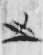之
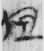侸
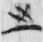之
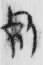死
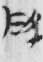阩
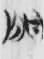門
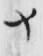又
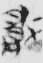敗
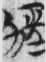勁
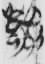猬
